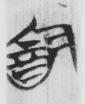酓
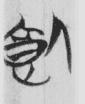飤
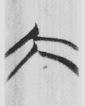大
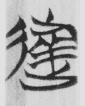{辶止㚔}
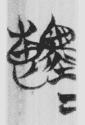{叀墨}=
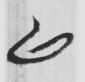㠯（以）
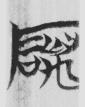礪
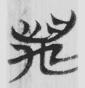萬
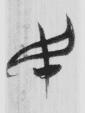民
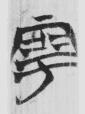𩁹
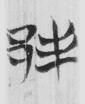邦
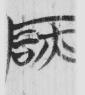庶
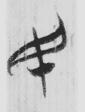民
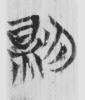則
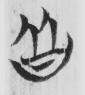皆
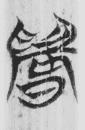{䢅日}
